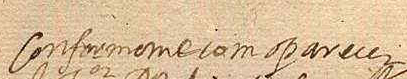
Conformome com o parecer
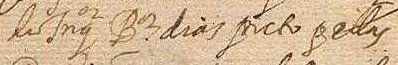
do Jnqor Bor. dias preto pellas
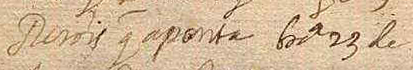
Rezoĩs q̄ aponta lxa 23 de
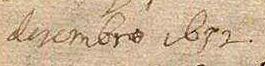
dezembro 1652.
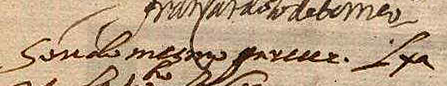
Sou do mesmo parecer. Lxa
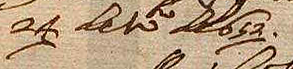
24 de 10bro de 652.
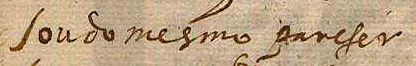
Sou do mesmo pareser
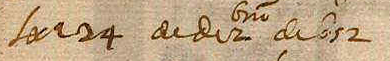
Lxa 24 de dezbro de 652
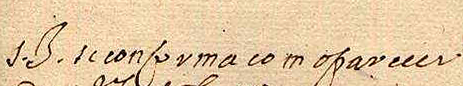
s. J. se conforma com o parecer.
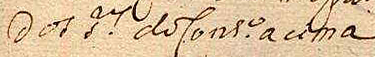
dos sres. do Cons.o acima.
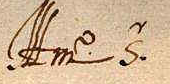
Illm.o S.r
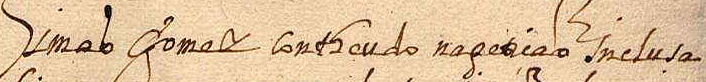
Simaõ Gomez contheudo na petiçaõ Inclusa
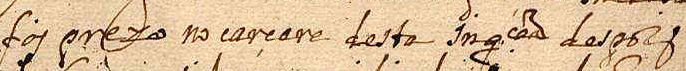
foj prezo no carçere desta Inq.cão de despois
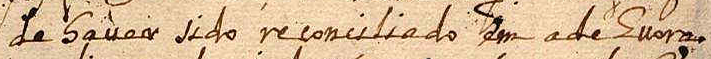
de hauer sido reconciliado em a de Euora
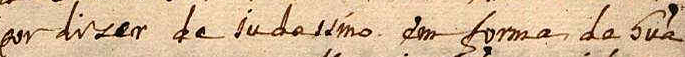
por dizer de Iudaismo em forma de huā
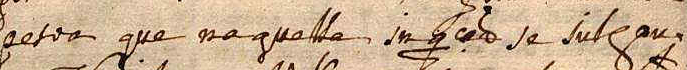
pesoa que naquella inq.caõ se Iulgou
